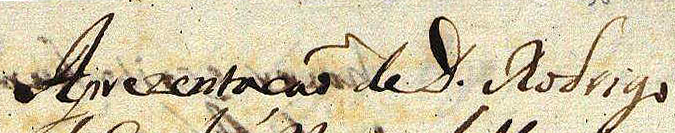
Aprezentaçaõ de D. Rodrigo
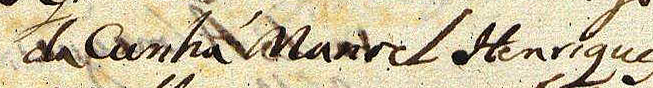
da Cunha Manoel Henriques
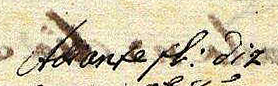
Adiante fl: diz
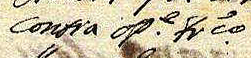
contra o P.e Frco
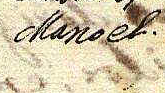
Manoel.
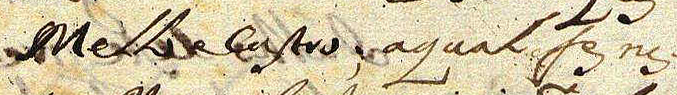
Mello e castro, a qual fes nes
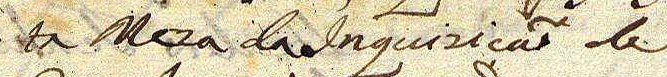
ta Meza da Inquiziçaõ de
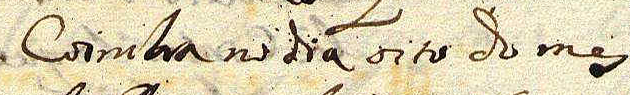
Coimbra no dia oito do mes
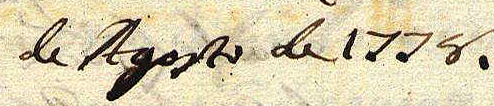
de Agosto de 1778.
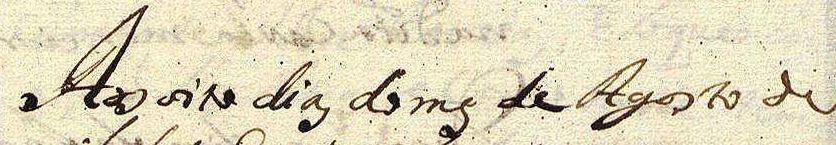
Ao oito dias do mes de Agosto de
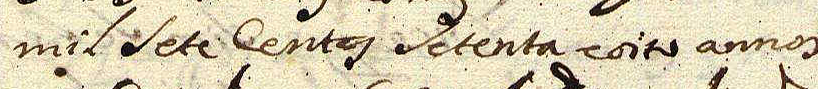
mil seteCentos setenta e oito annos
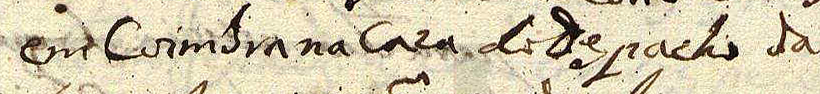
em Coimbra na caza do Despacho da
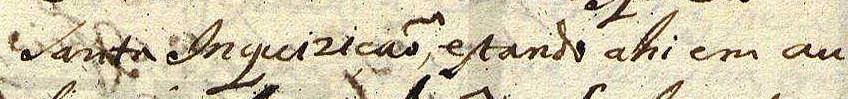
santa Inquiziçaõ, estando ahi em au
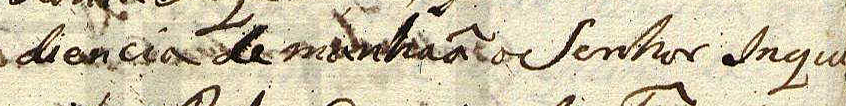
diencia de manhaã o Senhor Inqui
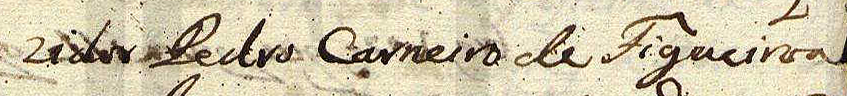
zidor Pedro Carneiro de Figueiroa
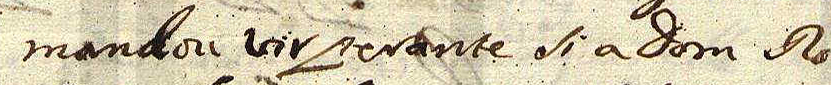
mandou vir perante si a Dom Ro
